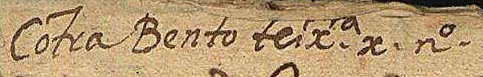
Cōtra Bento teixra. x. no-
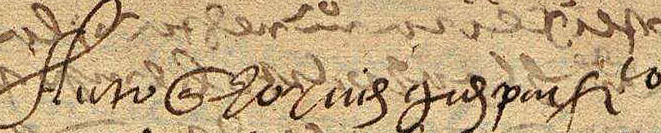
Auto q̄ ho yuis gaspar frco
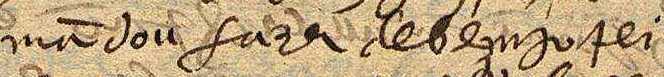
mādou fazer de bemto tei
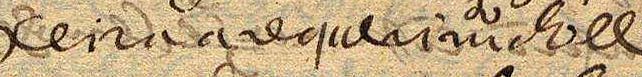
xeira a requerimto do le
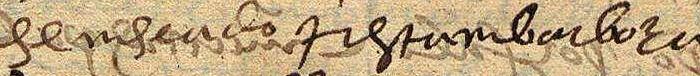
semseado tristam barboza
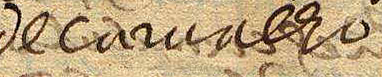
de carualho
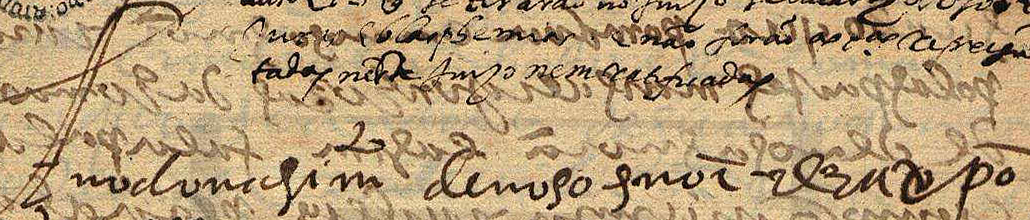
Ano do nasimeto de noso snor̄ yezu xpō
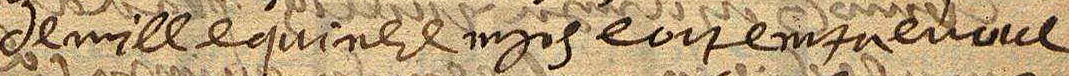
de mil e quinhemtos e oitemta e noue
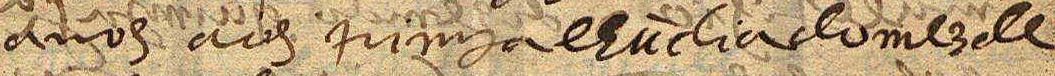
anos aos trimta e hū dia do mez de
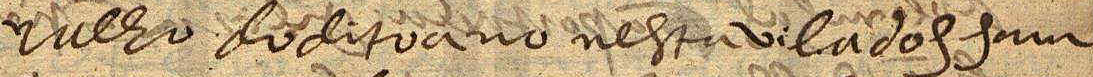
yulho do dito ano nesta vila dos sam
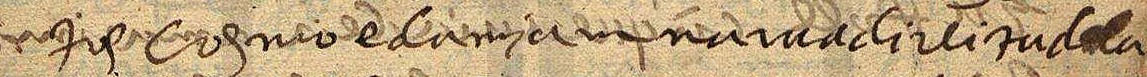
tos Cosmo e damiam na rua direita dela
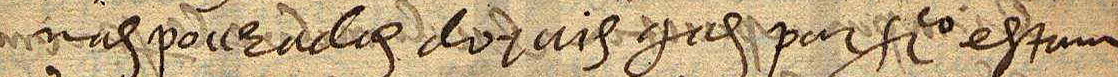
nas pouzadas do yuis gaspar frco estam
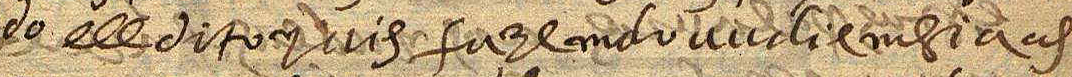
do ele dito yuis fazemdo audiemsia as
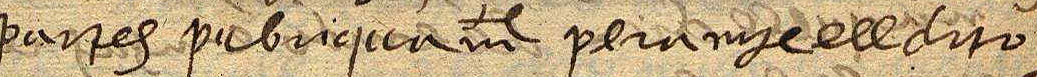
partes pubriquamte peramte ele dito
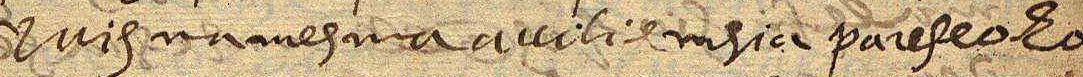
yuis na mesma audiemsia pareseo ho
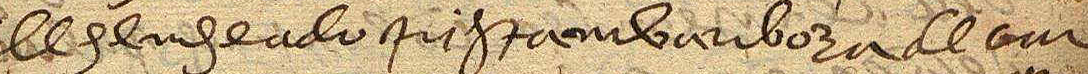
lesemseado tristam barboza de car
